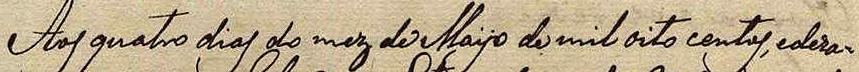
Aos quatro dias do mez de Mayo de mil oitocentos, e deza
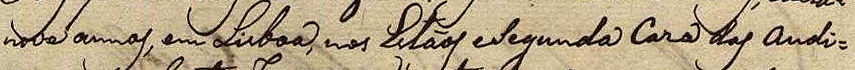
nove annos, em Lisboa, nos Estáos e segunda Caza das audi
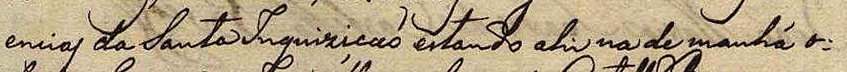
encias da Santa Inquiziçaõ estando ahi na de manhã o
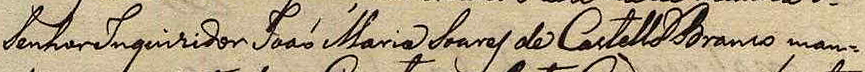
Senhor Inquizidor Ioaõ Maria Soares de Castello Branco man
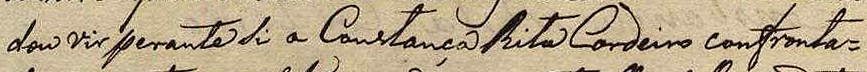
dou vir perante si a Constança Rita Cordeiro confronta=
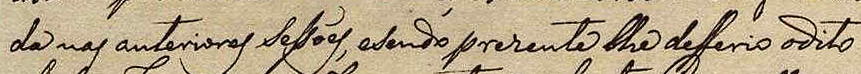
da nas anteriores sessoẽs, e sendo prezente lhe defferio o dito
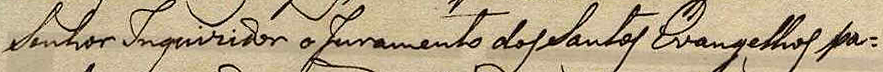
Senhor Inquizidor o Juramento dos Santos Evangelhos pa
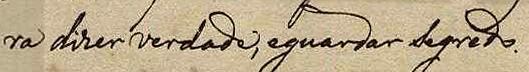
ra dizer verdade, e guardar segredo.
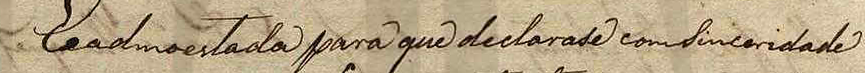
E admoestada para que declarase com Sinceridade
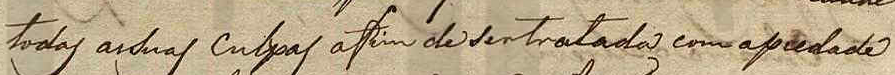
todas as suas culpas afim de ser tratada com a piedade
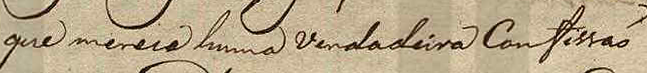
que merece huma verdadeira Confissaõ
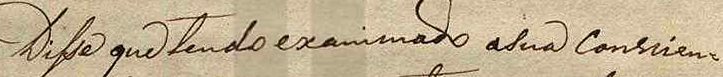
Disse que tendo exanimado a sua conscien
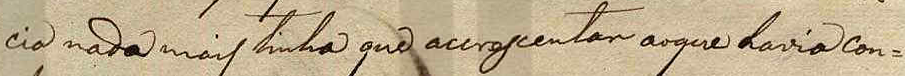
cia nada mais tinha que accrescentar ao que havia con
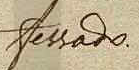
fessado.
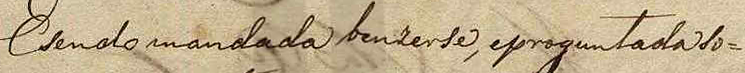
E sendo mandada benzerse, e proguntada so
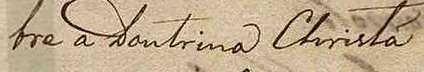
bre a Doutrina Christã
